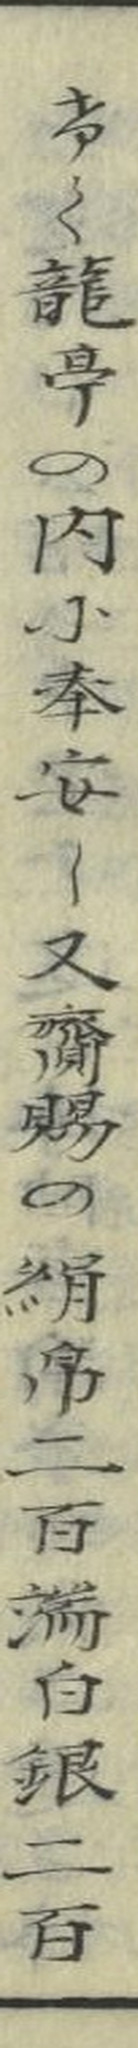けて龍亭の内に奉安し又齎賜の絹帛二百端白銀二百
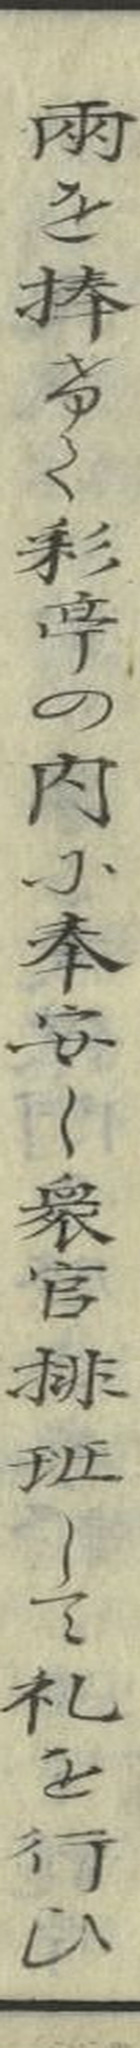両を捧けて彩亭の内に奉安し衆官排班して礼を行ひ
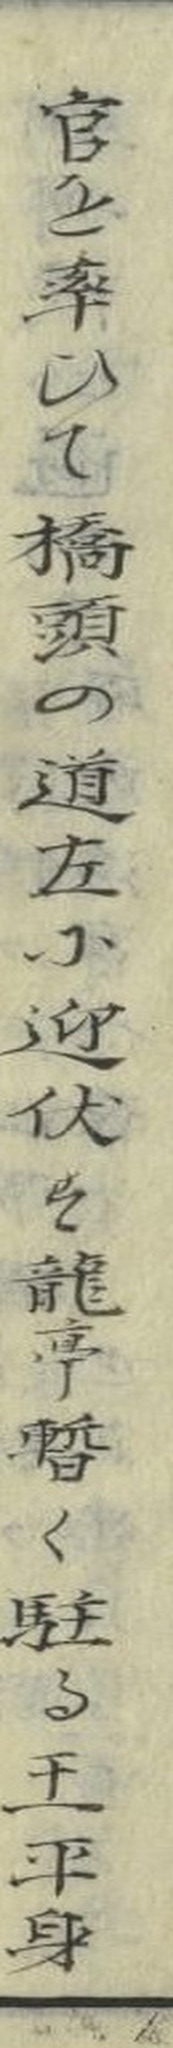官を率ひて橋頭の道左右に迎伏す龍亭暫く駐る王平身
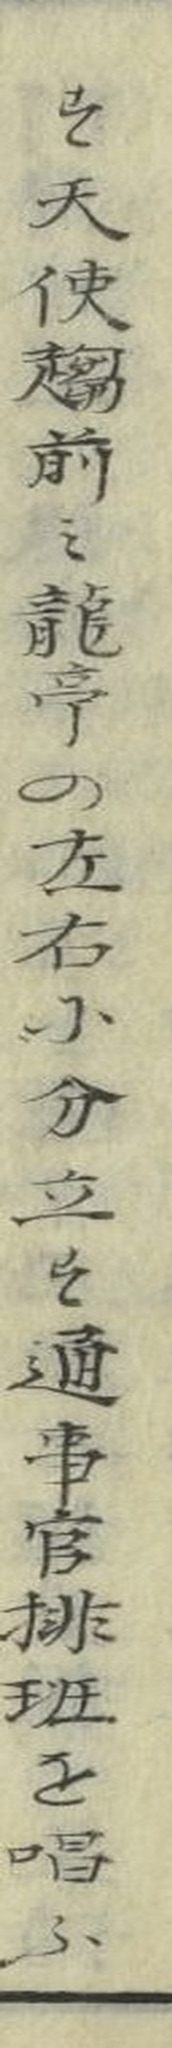す天使趨前み龍亭の左右に分立す通事官排班を唱ふ
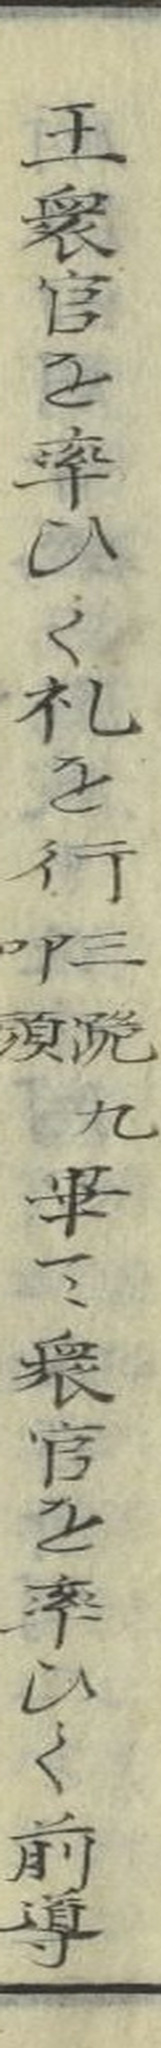王衆官を率ひて礼を行三跪九叩頭畢て衆官を率ひて前導
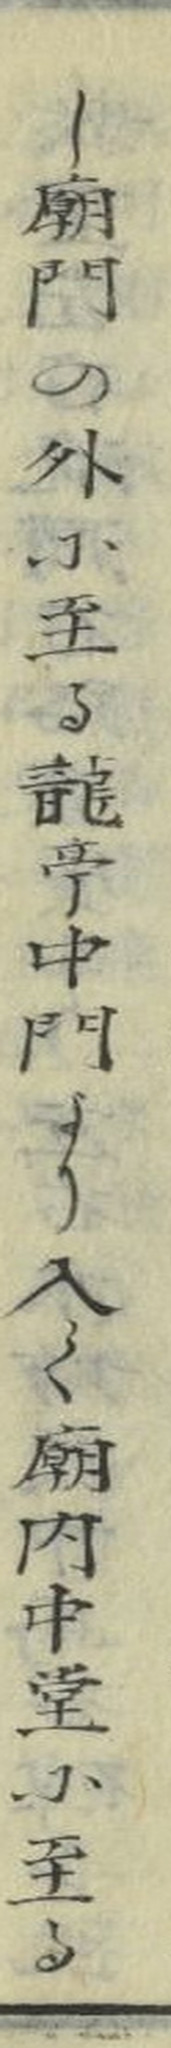し廟門の外に至る龍亭中門より入て廟内中堂に至る
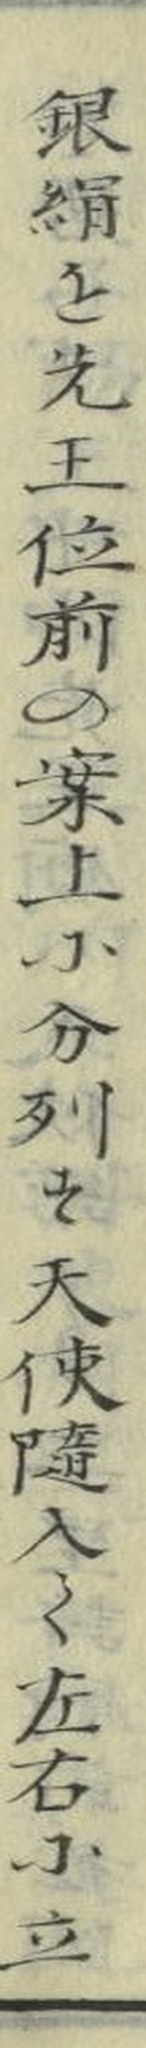銀絹を先王位前の案上に分列す天使隋入て左右に立
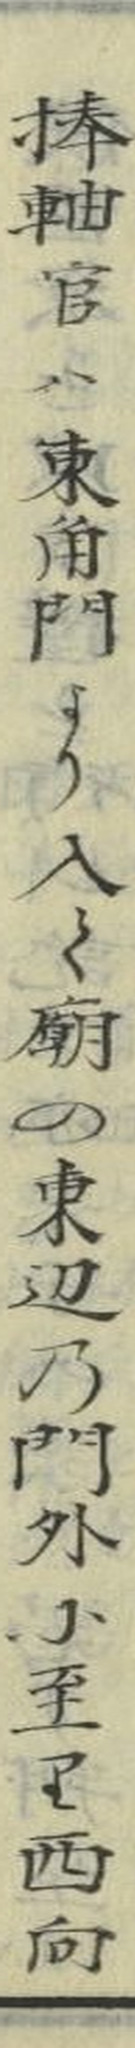捧軸官は東角門より入て廟の東辺の門外に至り西向
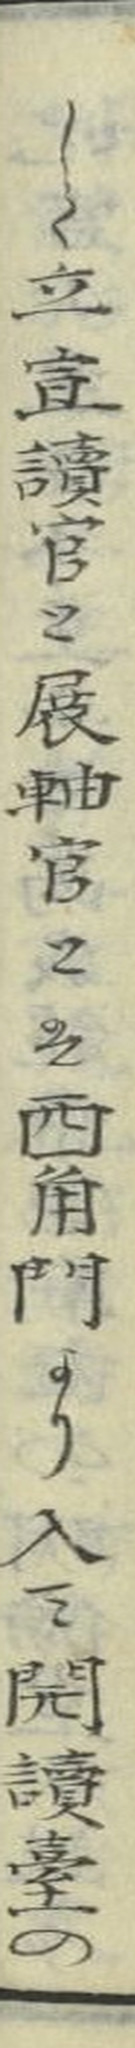して立宣読官と展軸官とは西角門より入て開読台の
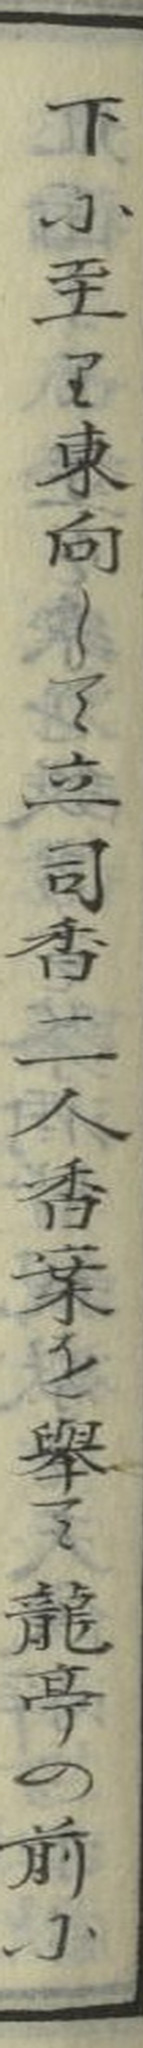下に至り東向して立司香二人香案を挙て龍亭の前に
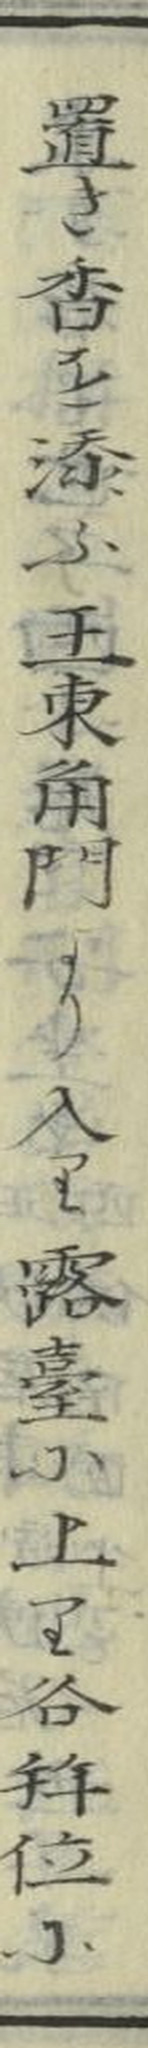置き香を添ふ王東角門より入り露台に上り各拝位に
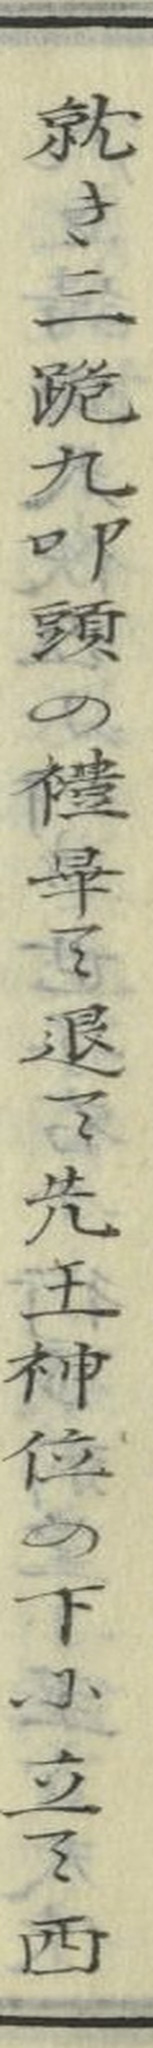就き三跪九叩頭の礼畢て退て先王神位の下に立て西
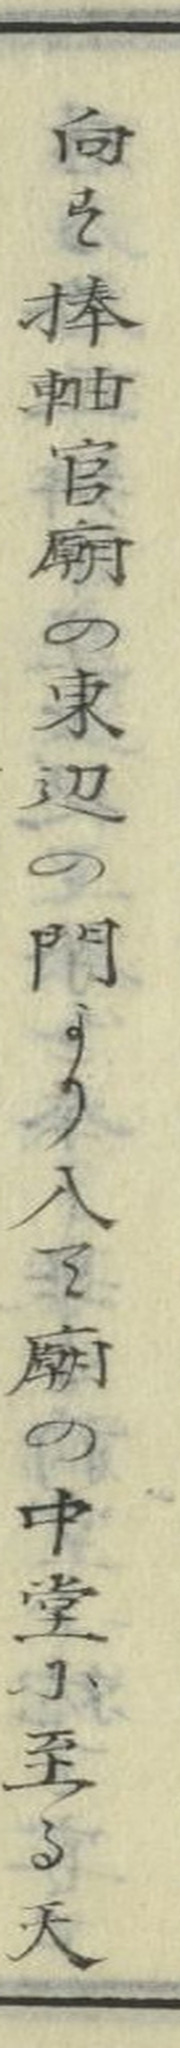向す捧軸官廟の東辺の門より入て廟の中堂に至る天
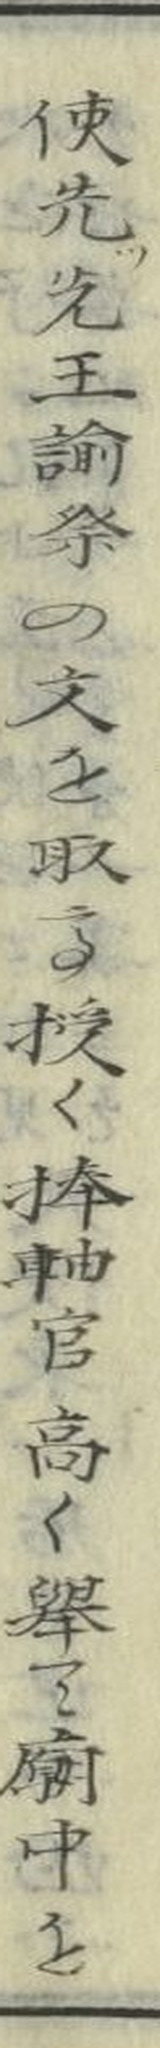使先先王諭祭の文を取て授く捧軸官高く挙て廟中を
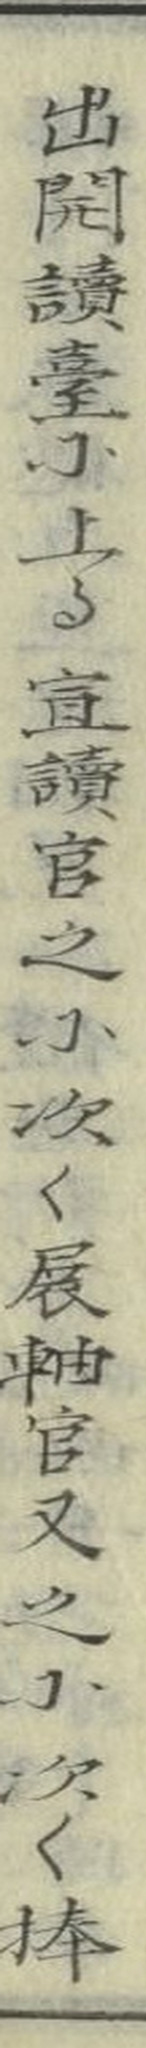出開読台に上る宣読官之に次く展軸官又之に次く捧
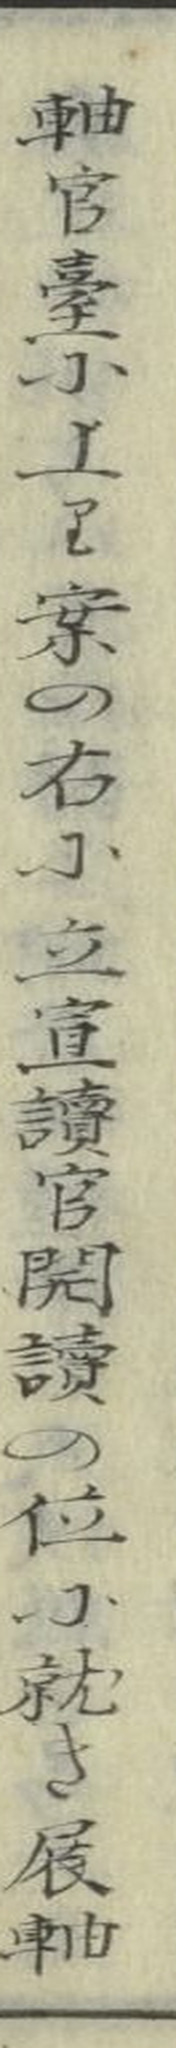軸官台に上り案の右に立宣読官開読の位に就き展軸
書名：琉球沿革志 下
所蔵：University of the Ryukyus Library
